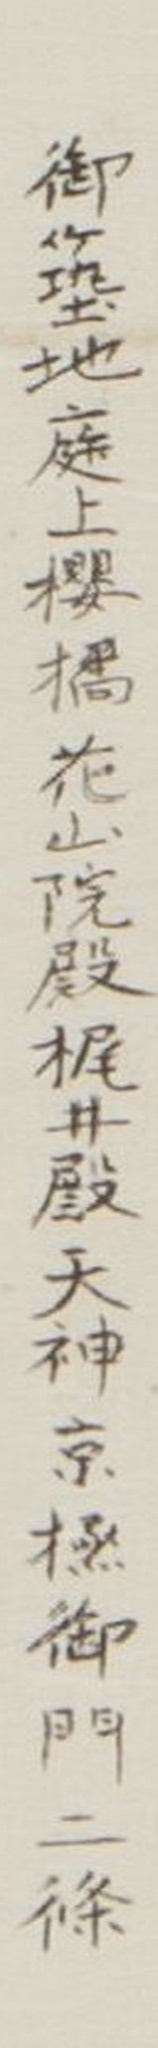御築地庭上桜橘花山院殿梶井殿天神京極御門二条
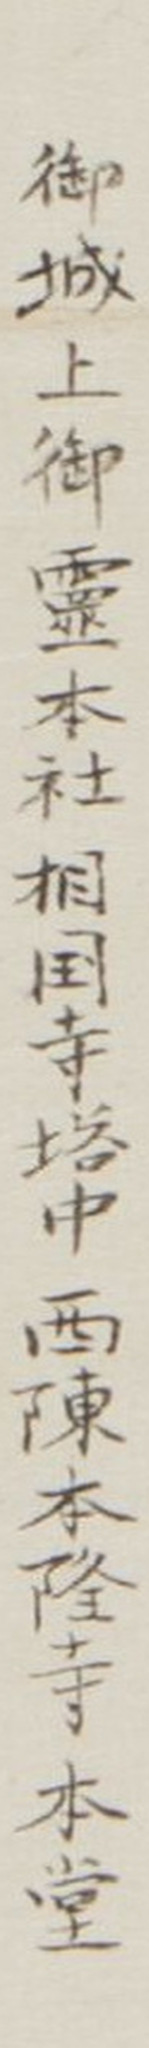御城上御霊本社相国寺塔中西陳本隆寺本堂
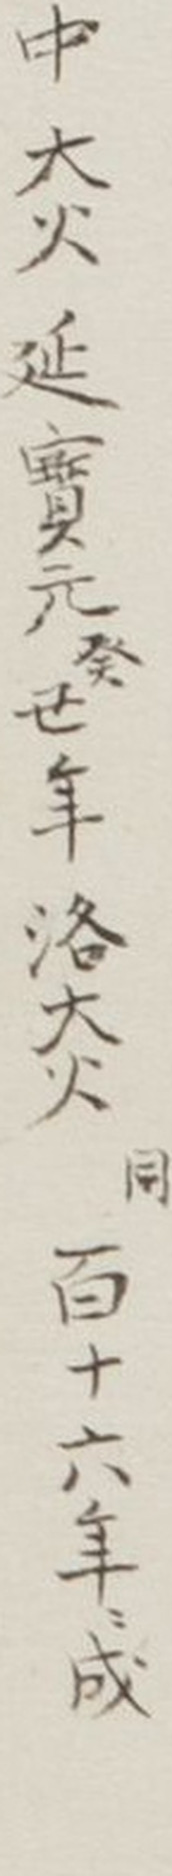洛中大火延宝元癸丑年洛大火同百十六年に成
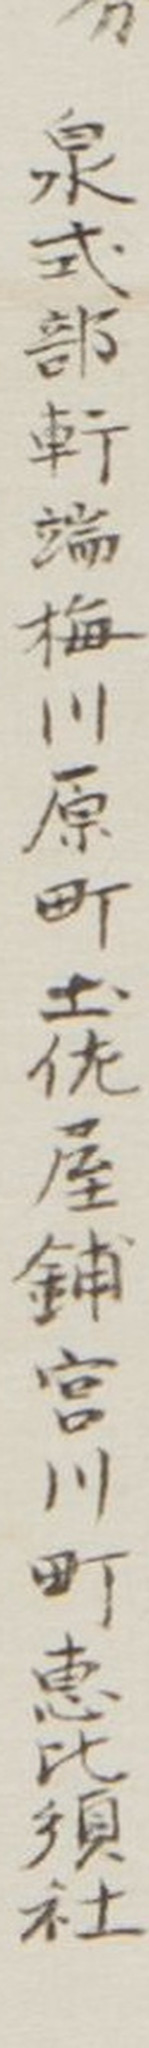[和]泉式部軒端梅川原町土佐屋鋪宮川町恵比須社
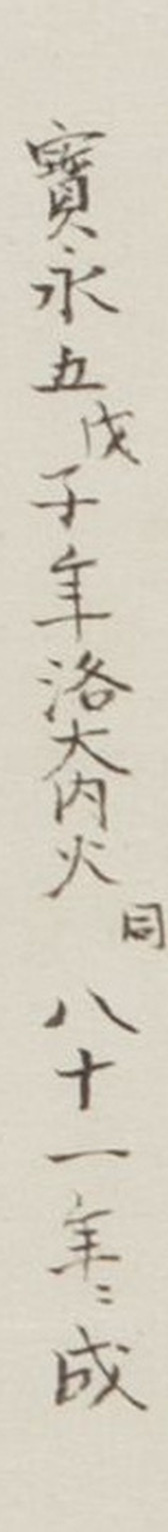宝永五戊子年洛大内火同八十一年に成
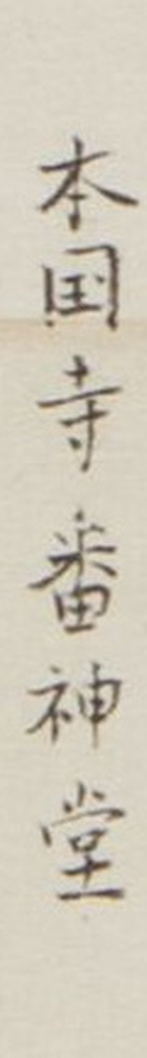本国寺番神堂
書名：天明八年京都大火図
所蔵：あいおいニッセイ同和損保株式会社
